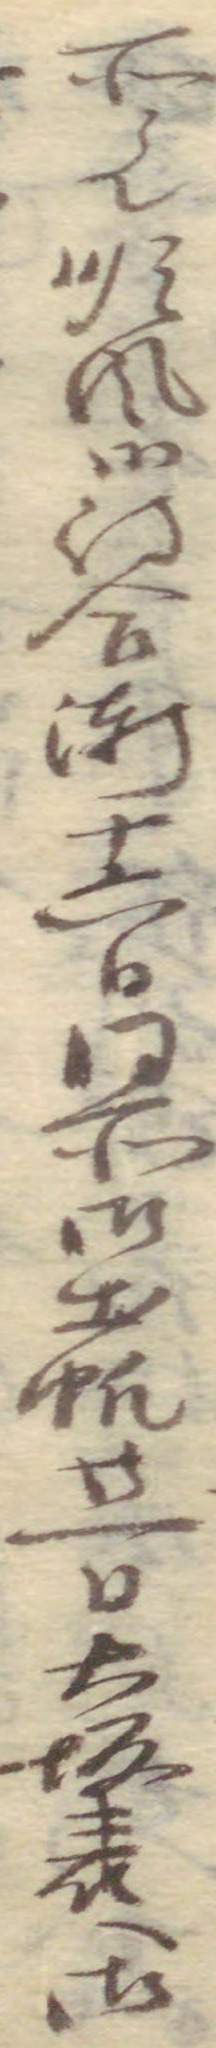所ニて順風御待合漸十六日同所御出帆廿一日大坂表へ御
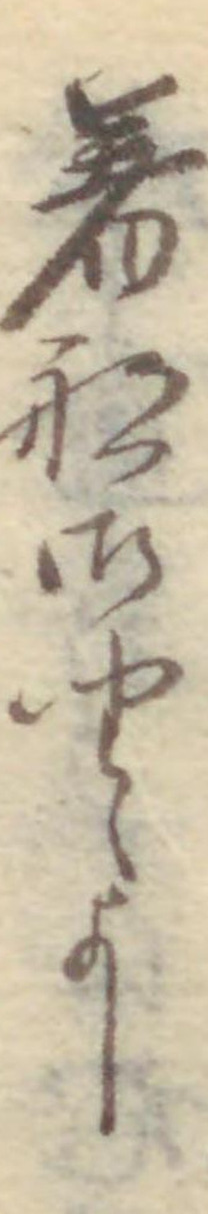着船御坐候よし
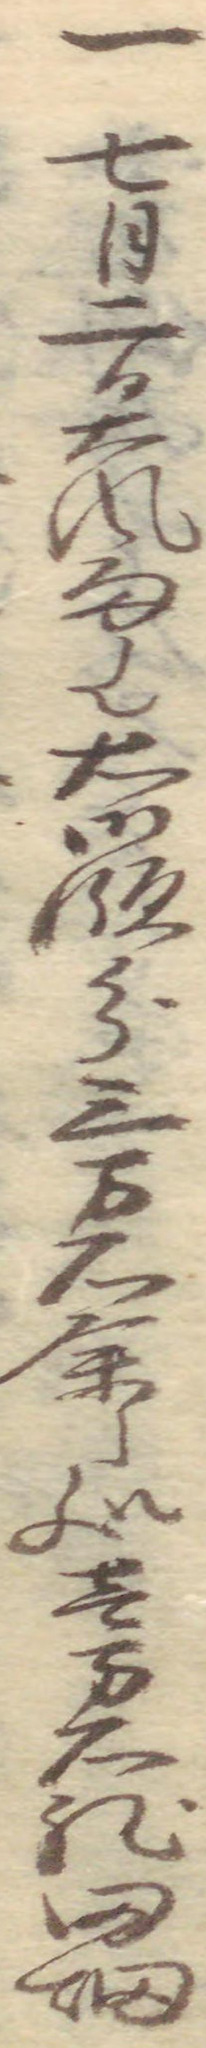一七月二日大風雨ニて右御領分三万石余之処壱万石程田畑
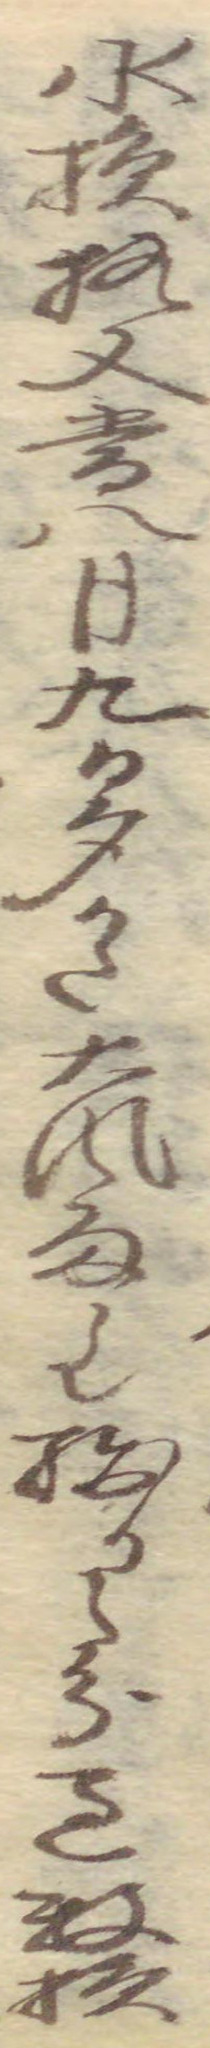水損猶又当八月九日夕かた大風雨ニて残り之分過数損
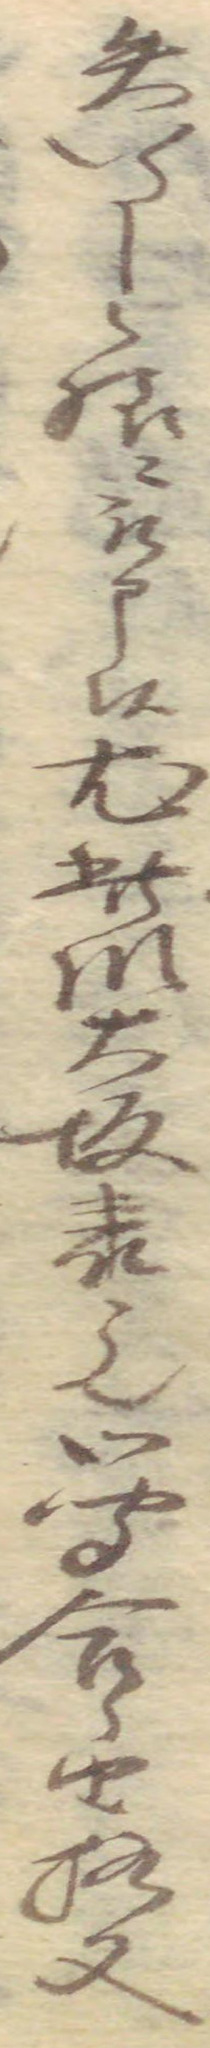失いたし候様ニ被申候尤此段大坂表ニて御聞合候由猶又
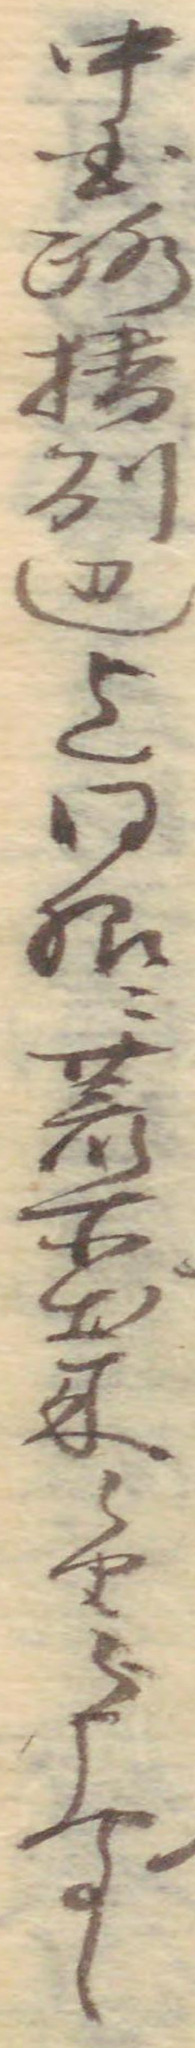中国路播州辺迄同様ニ荒所出来候由被申聞候

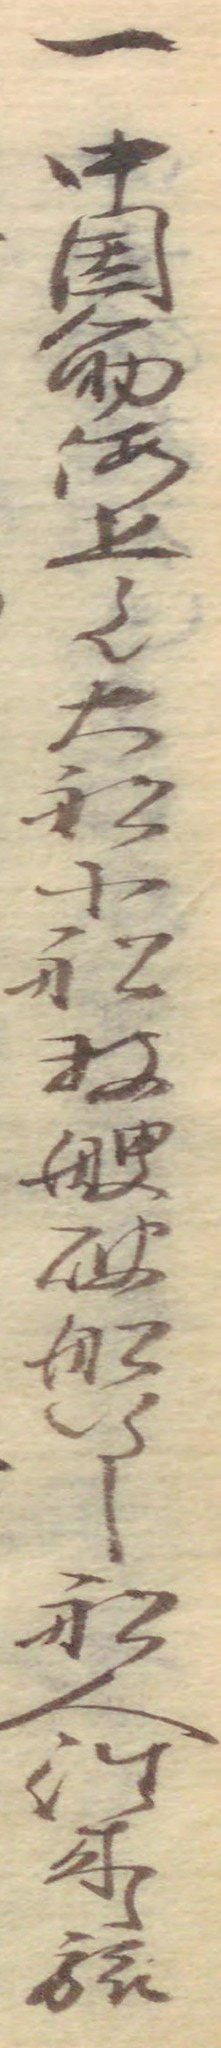一中国筋海上ニて大船小船数艘破船いたし船人往来之旅
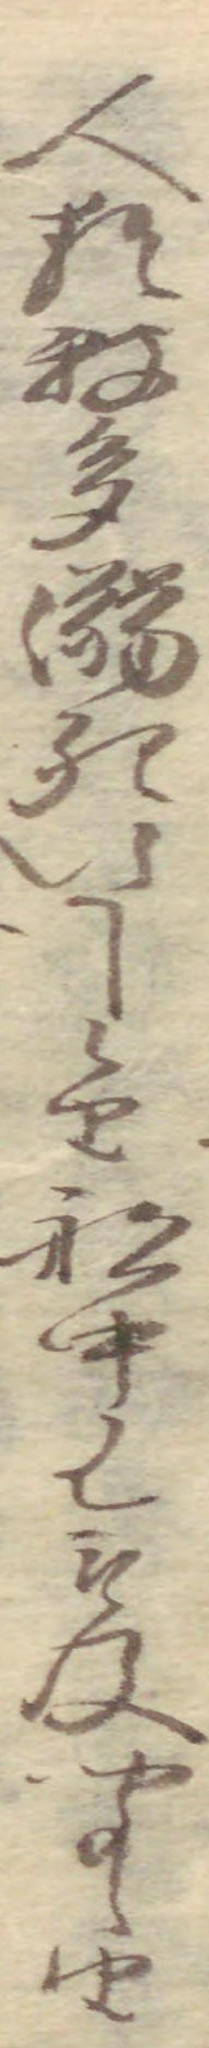人類数多溺死いたし候由船中ニて被及聞候由
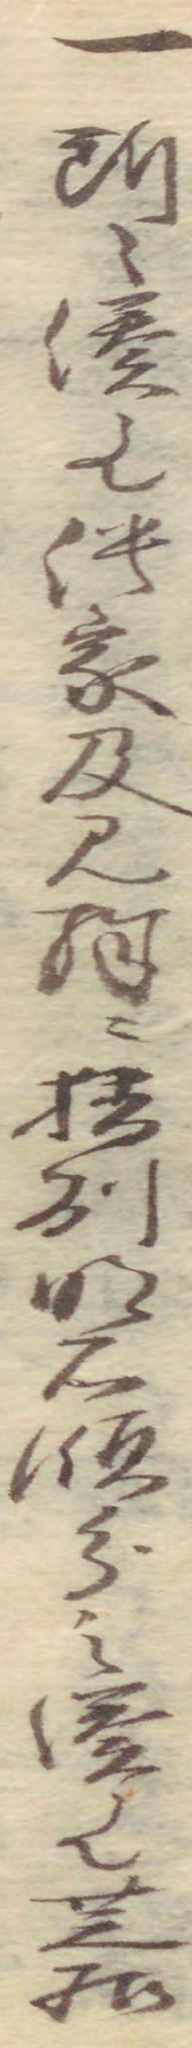一所々湊ニて潰家及見殊ニ播州明石領分之湊にてニて芝居
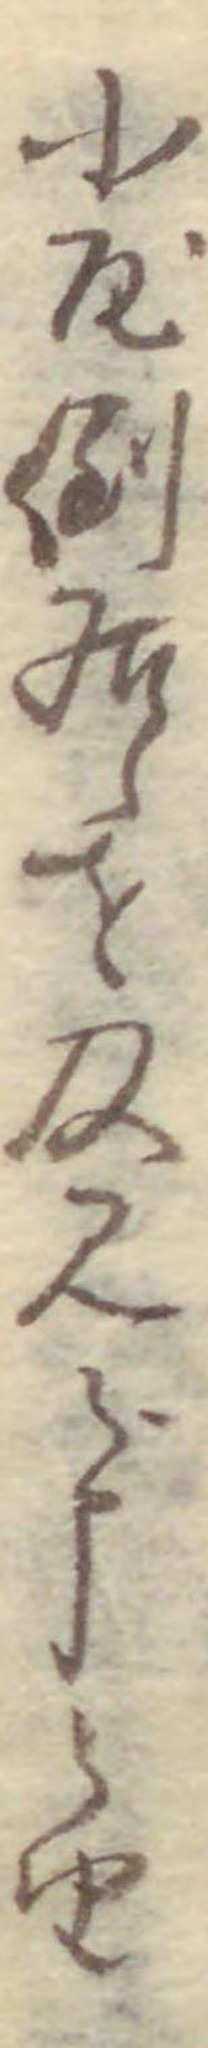小屋倒居候を及見被申候由
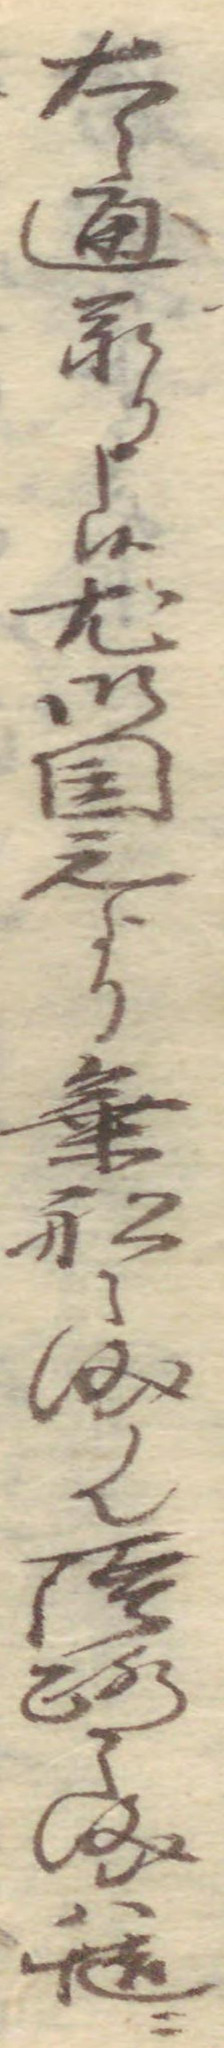右之通承り申候尤御国元より乗船候儀ニて陸路之儀ハ慥ニ
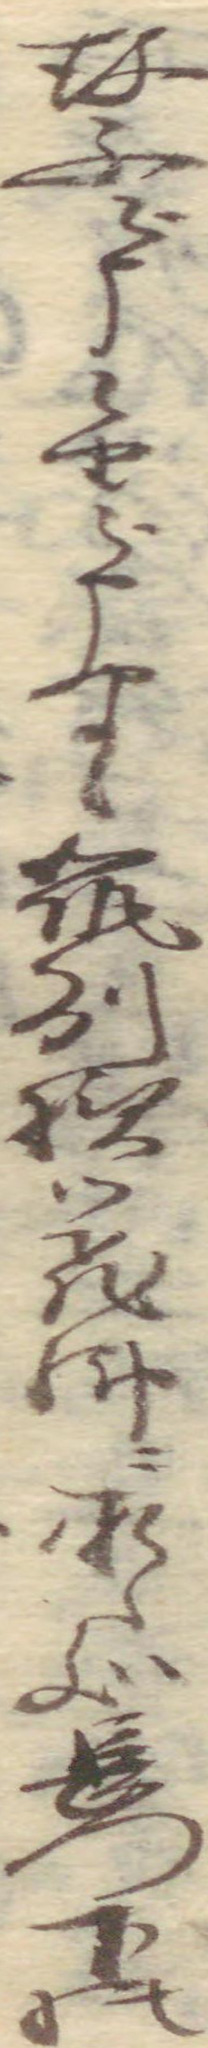存不被申候由被申聞候筑州様御飛脚ニ承候処長門下の
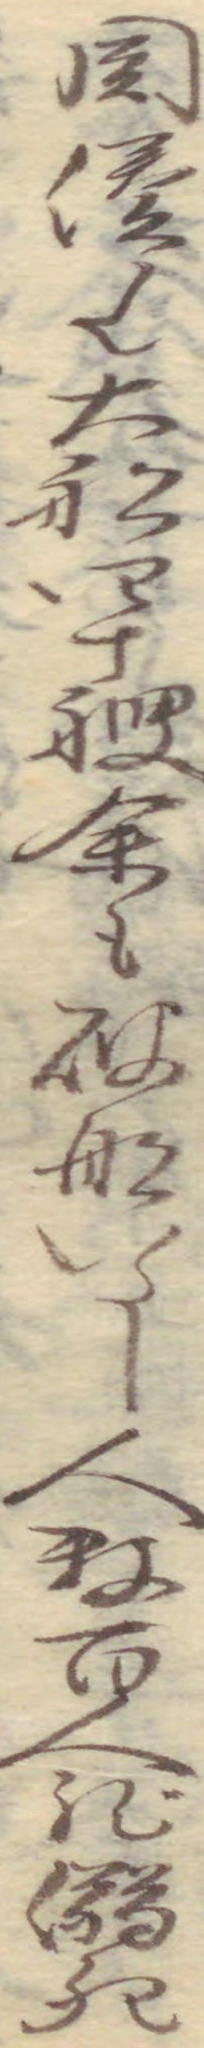関湊ニて大船四十艘余も破船いたし人数百人程溺死
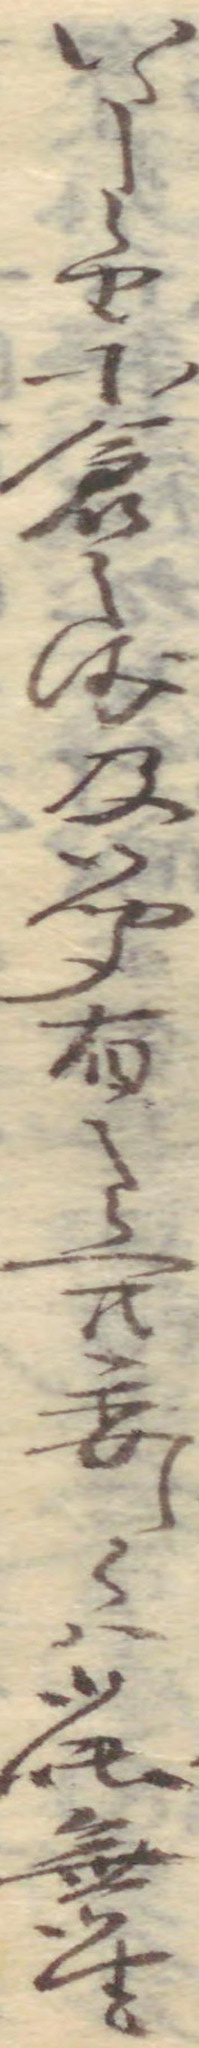いたし候由小倉之儀及御聞有之候へ共委しくハ御咄無御座候
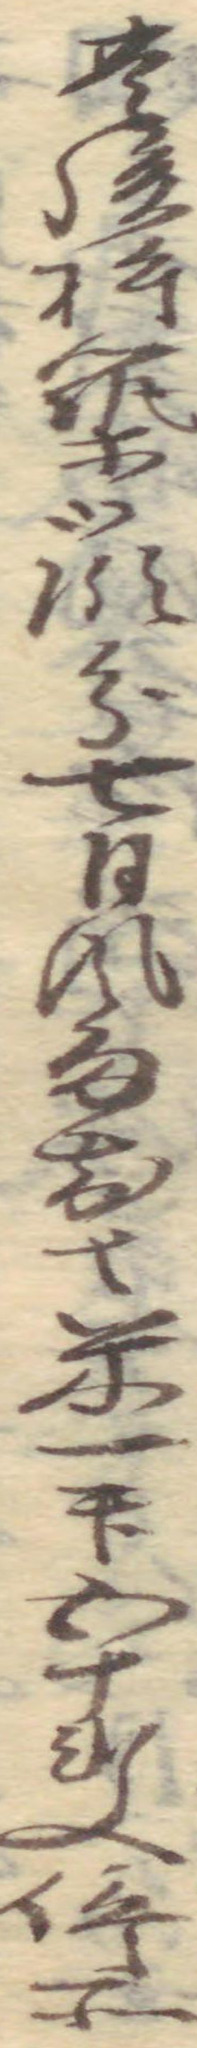豊後杵築御領分七月風雨前は米一升五十弐文位之所
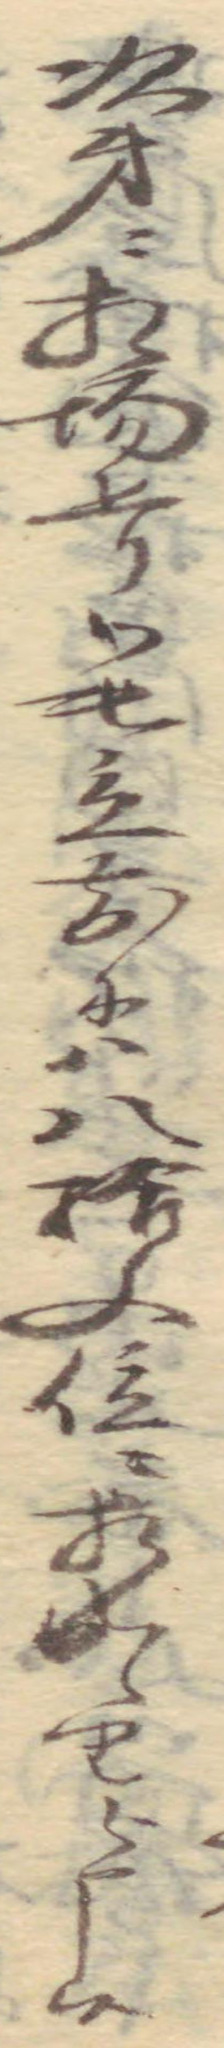次第ニ相場上り御出立前にハ八拾文位ニ相成候由被申候
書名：鶯宿雑記. 巻199-200
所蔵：国立国会図書館 National Diet Library, JAPAN
